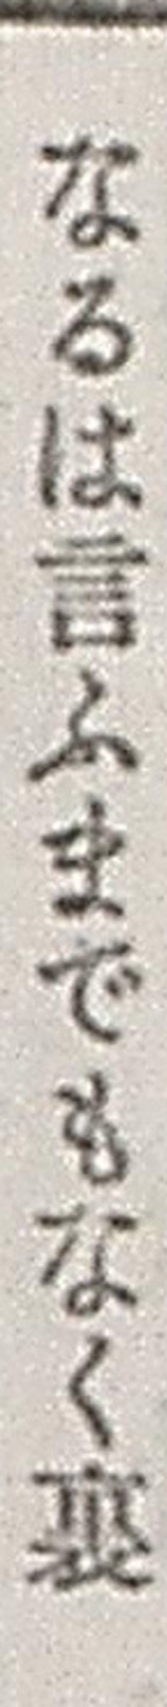なるは言ふまでもなく裏
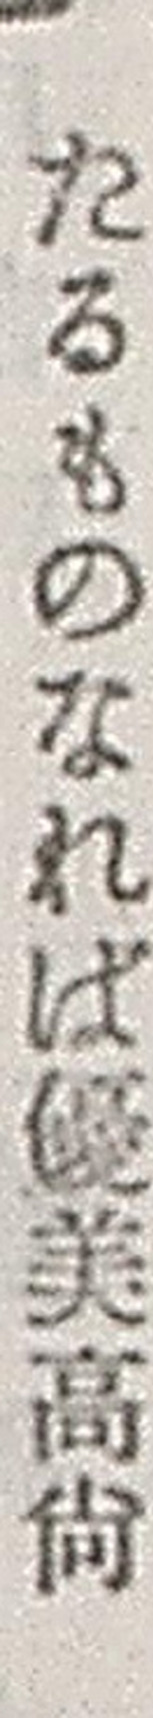たるものなれば優美高尚
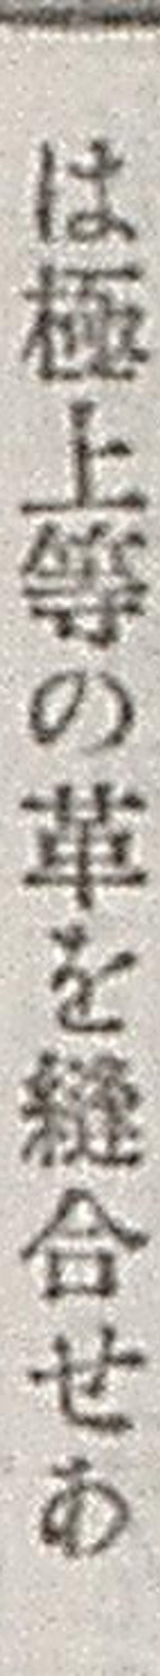は極上等の革を縫合せあ
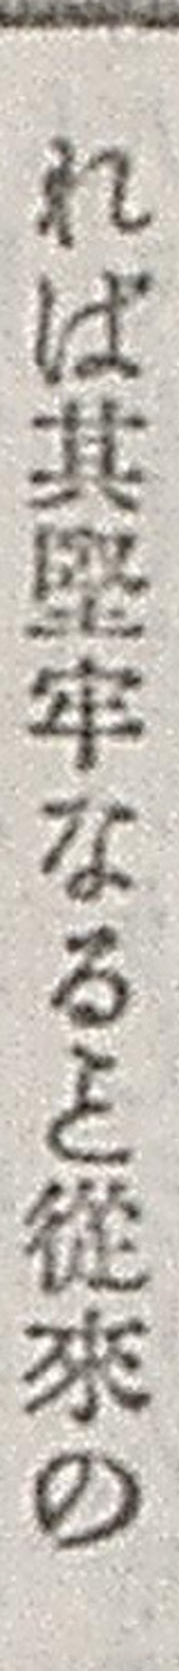れば其堅牢なること従来の
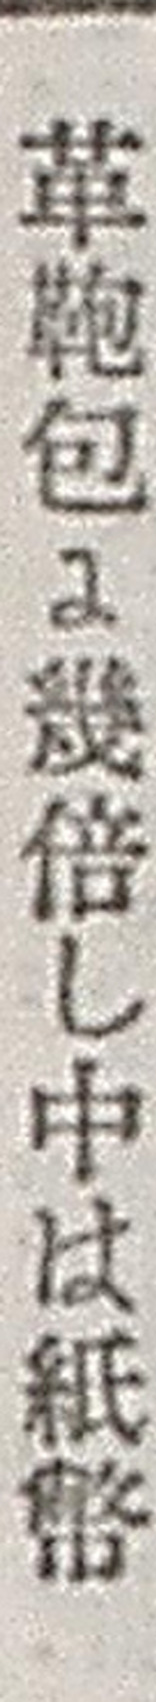革鞄包に幾倍し中は紙幣
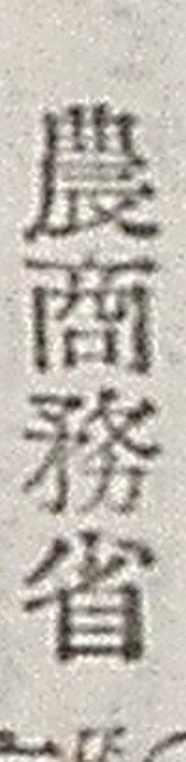農商務省
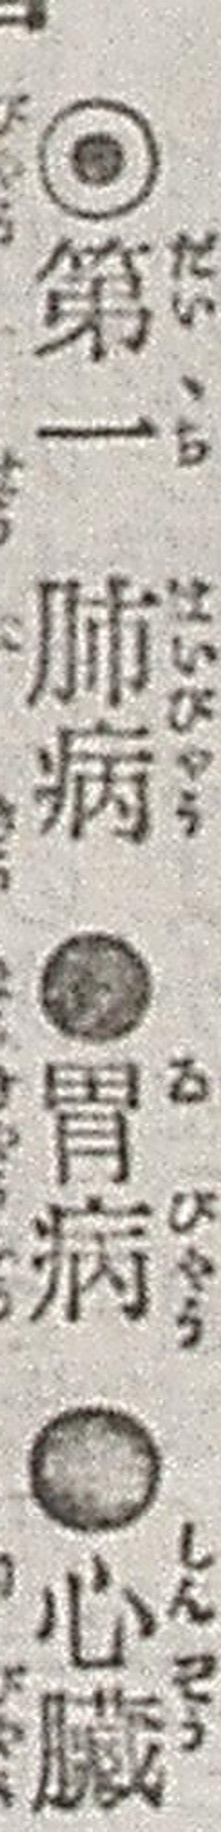⦿第一肺病●胃病●心臓
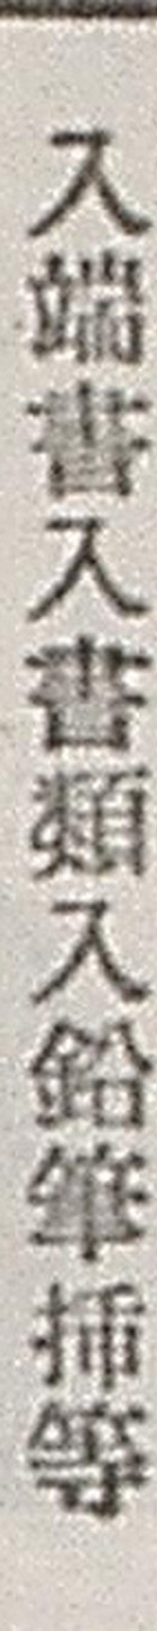入端書入書類入鉛筆挿等
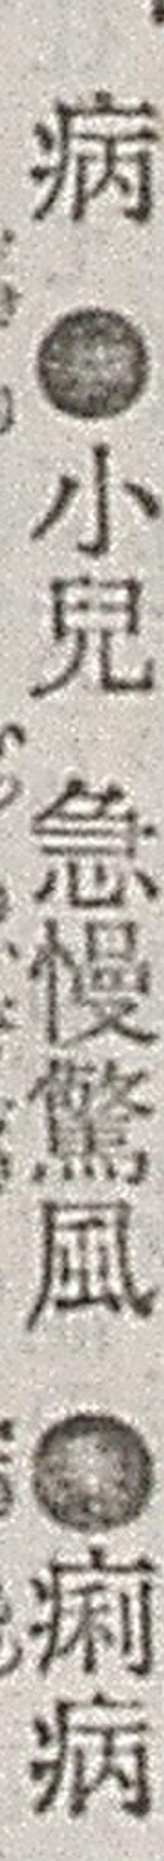病●小児急慢驚風●痢病
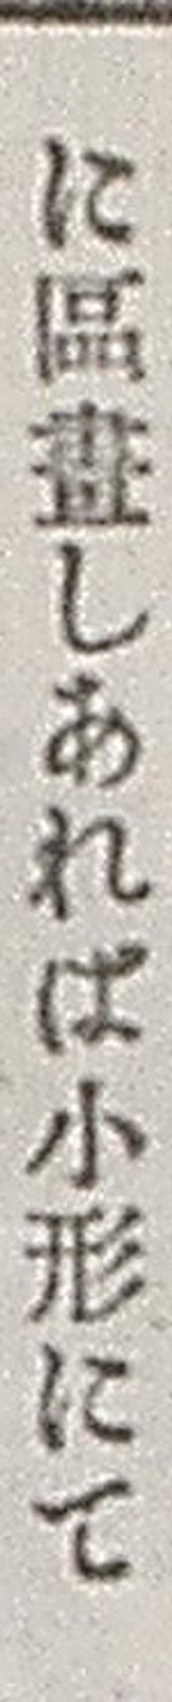に区画しあれば小形にて
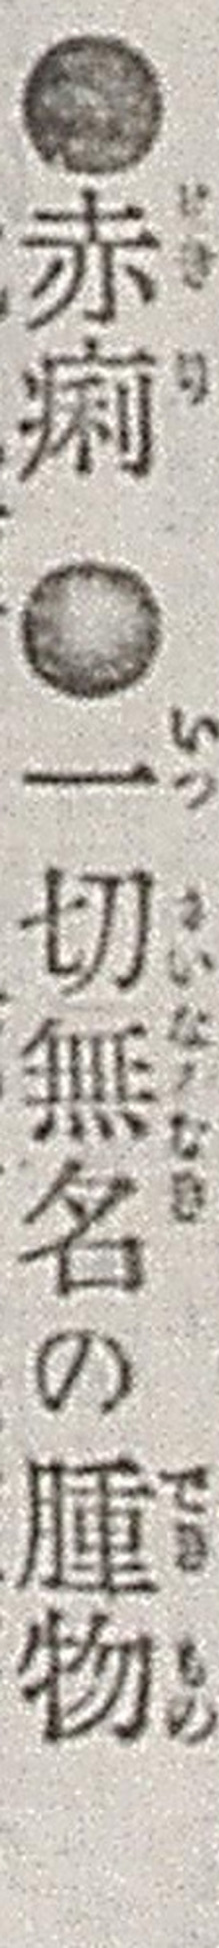●赤痢●一切無名の腫物
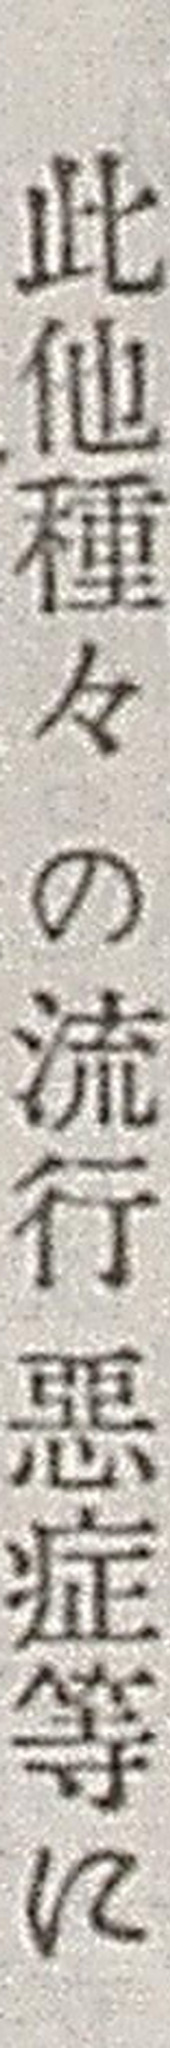此他種々の流行悪症等に
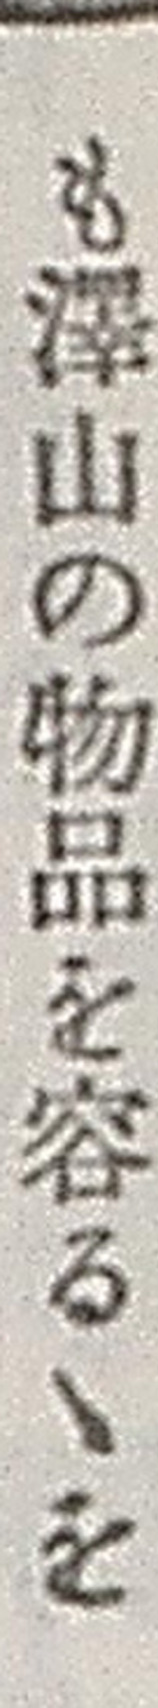も沢山の物品を容るゝを
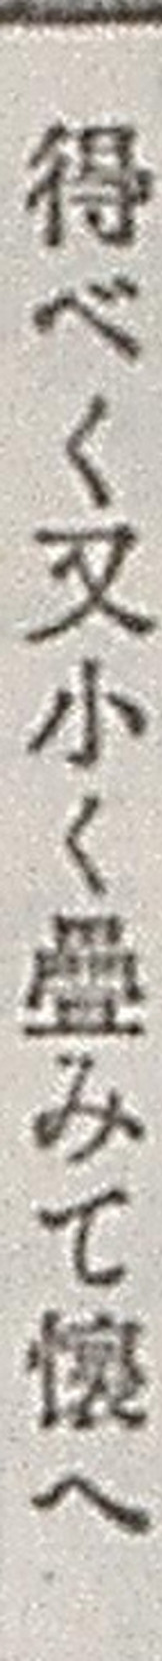得べく小く畳みて懐へ
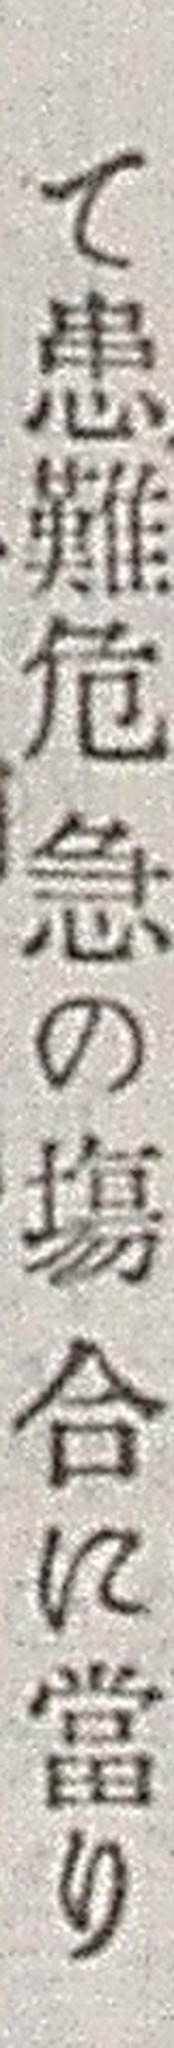て患難危急の場合に当り
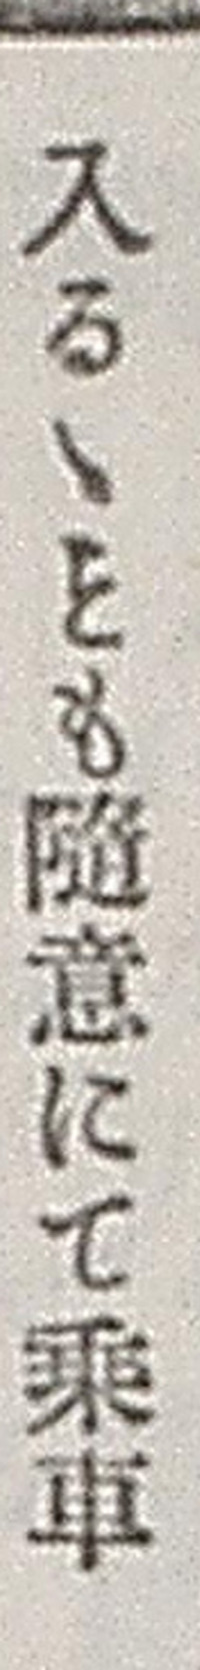入るゝことも随意にて乗車
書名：風俗畫報臨時増刊第百二十號　大海嘯被害録（下）
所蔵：東京大学地震研究所図書室 Earthquake Research Institute Library, The University of Tokyo, JAPAN
